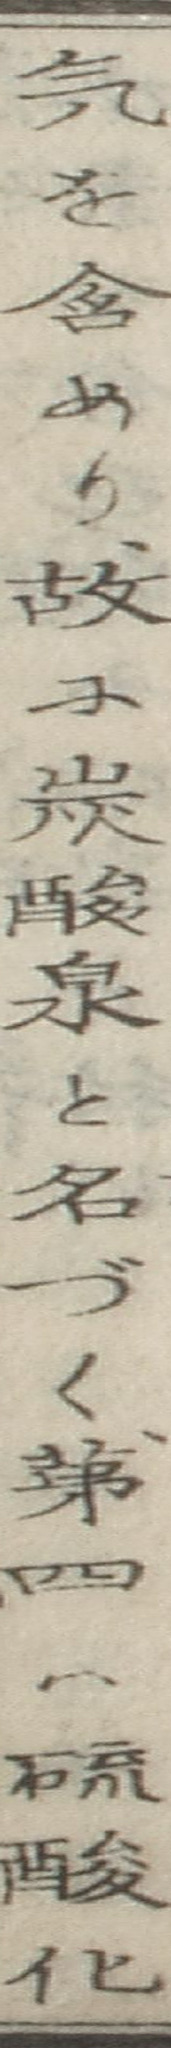気を含めり、故に炭酸泉と名づく、第四は硫酸化

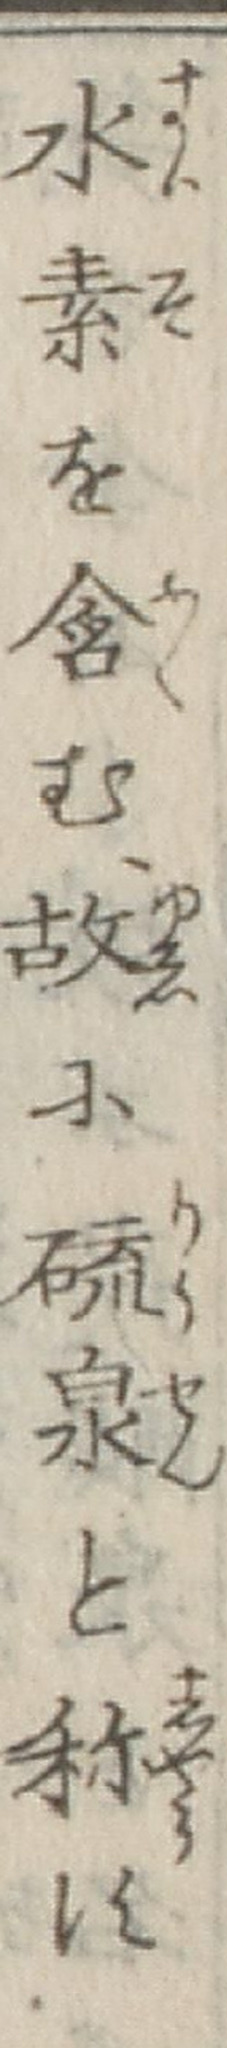水素を含む、故に硫泉と称す
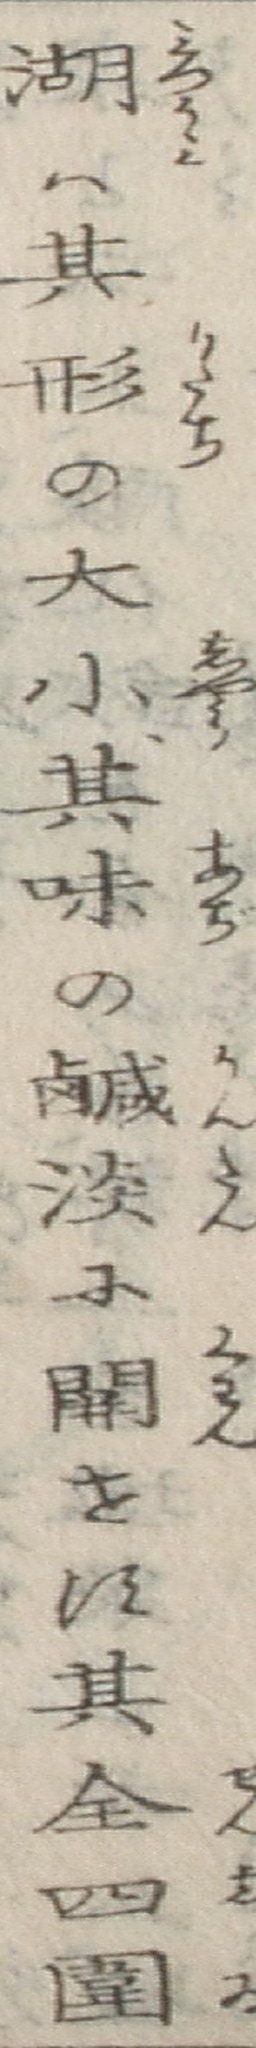湖は其形の大小、其味の鹹淡に関せす其全四囲
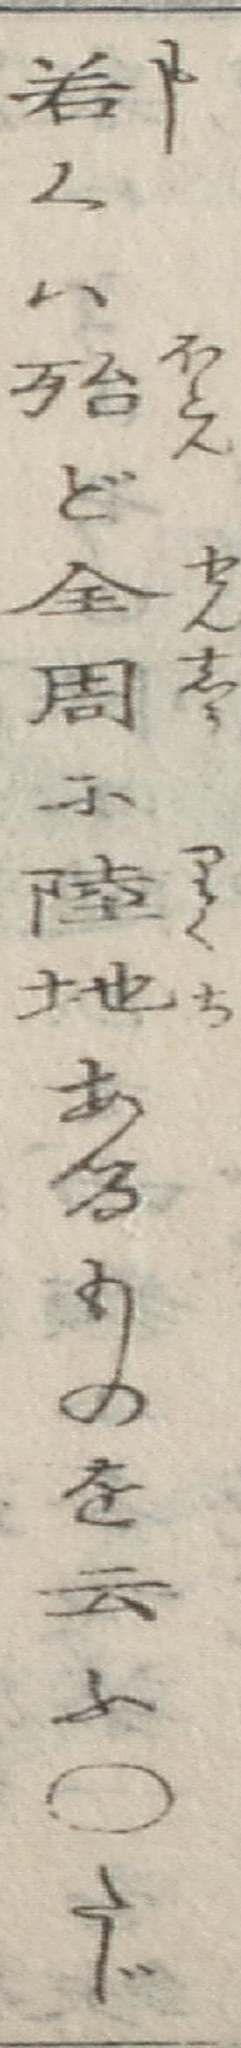若くは殆ど全周に陸地あるものを云ふ〇たゞ
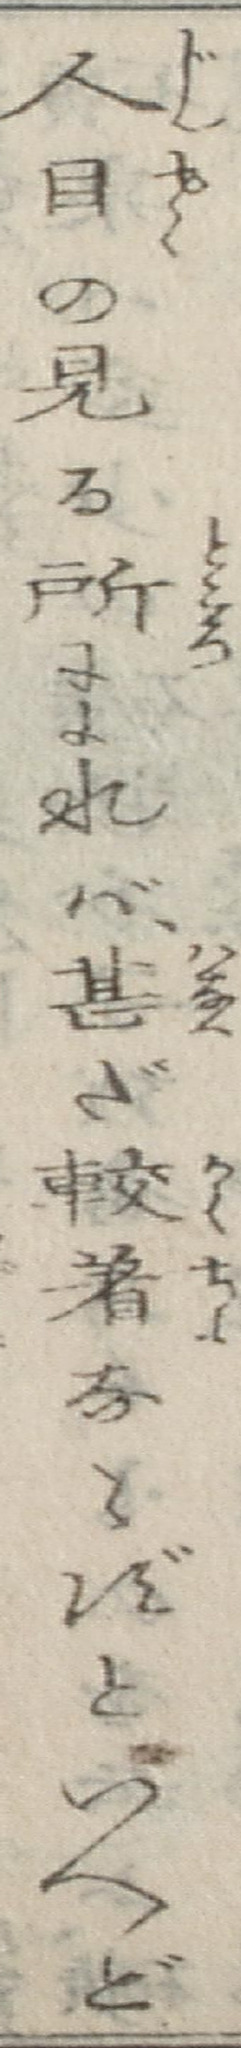人目の見る所によれば、甚だ較著ならずといへど
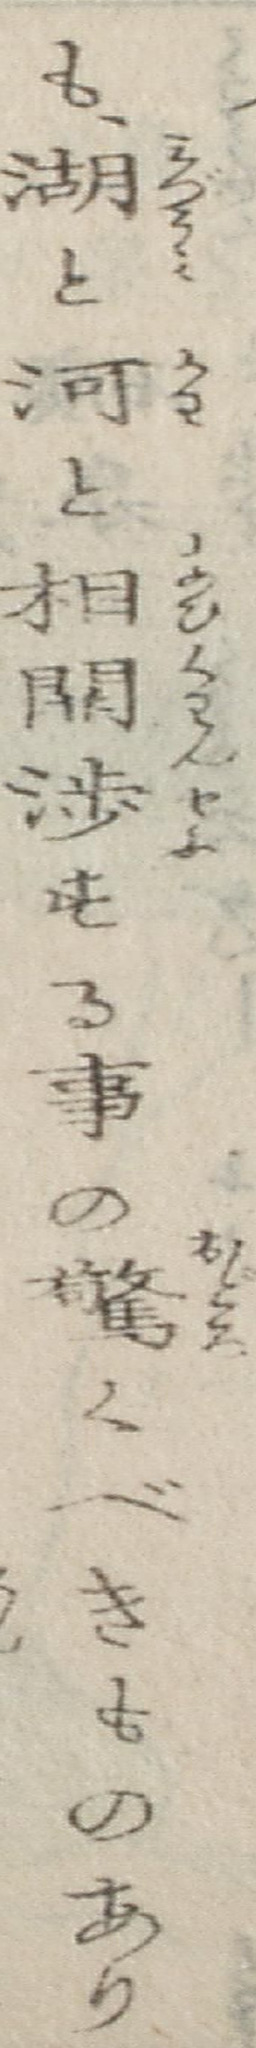も、湖と河と相関渉する事の驚くべきものあり
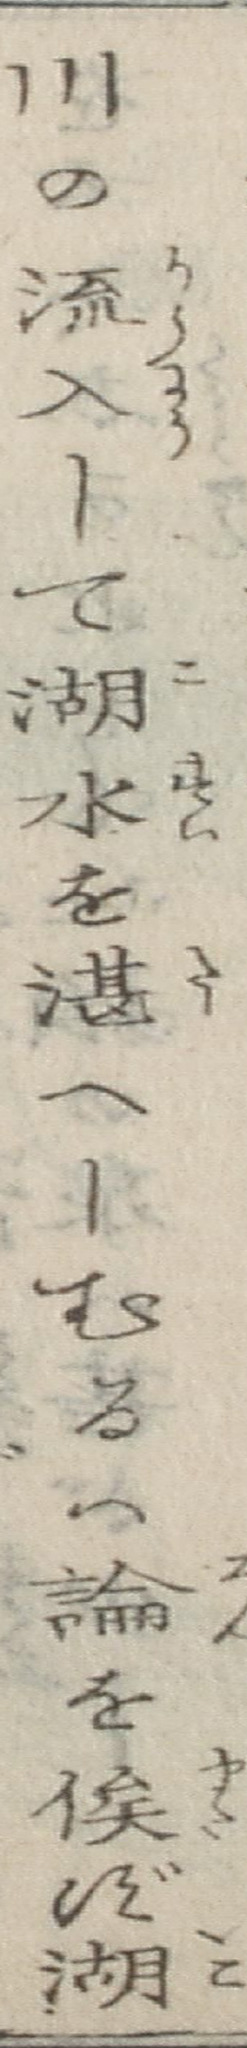川の流入して湖水を湛へしむるは論を俟ず、湖
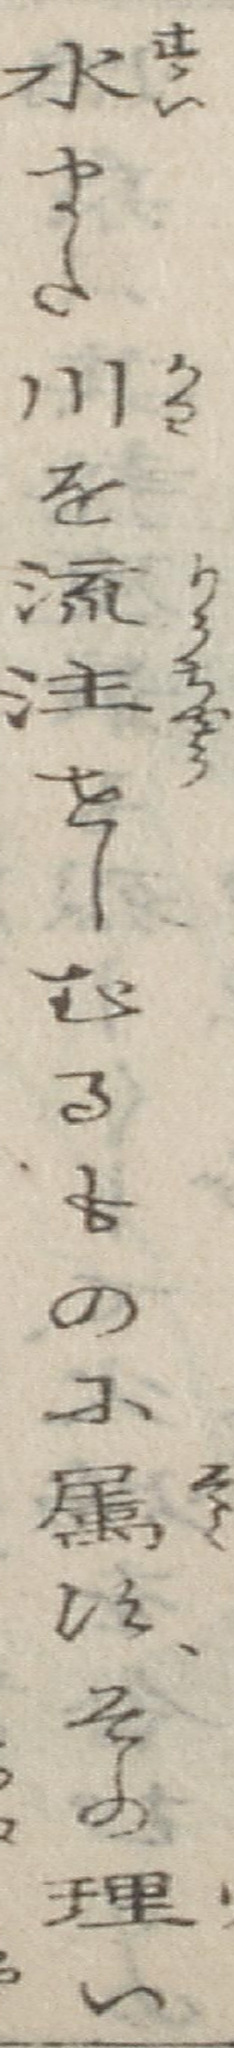水また川を流注せしむるものに属す、その理い
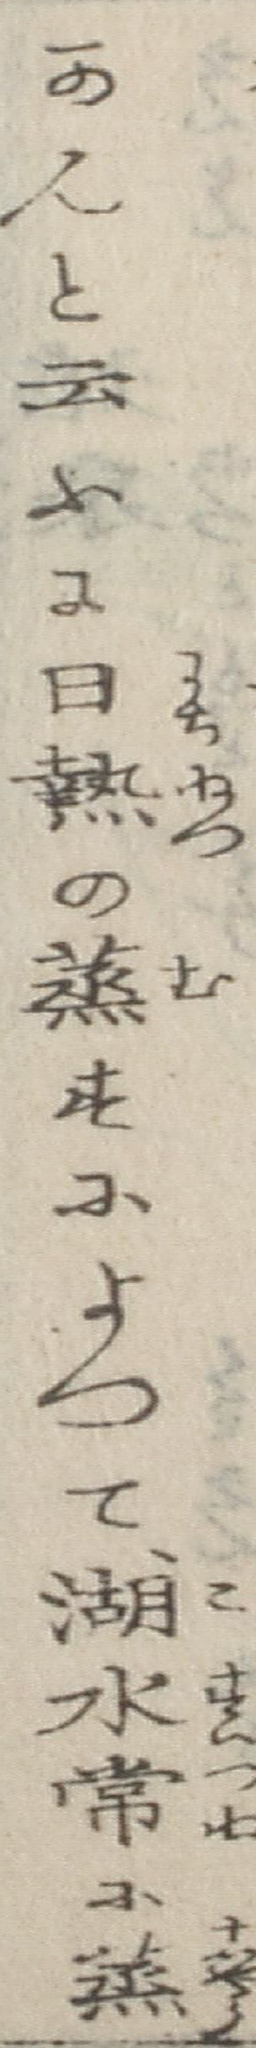かんと云ふに日熱の蒸すによつて、湖水常に蒸
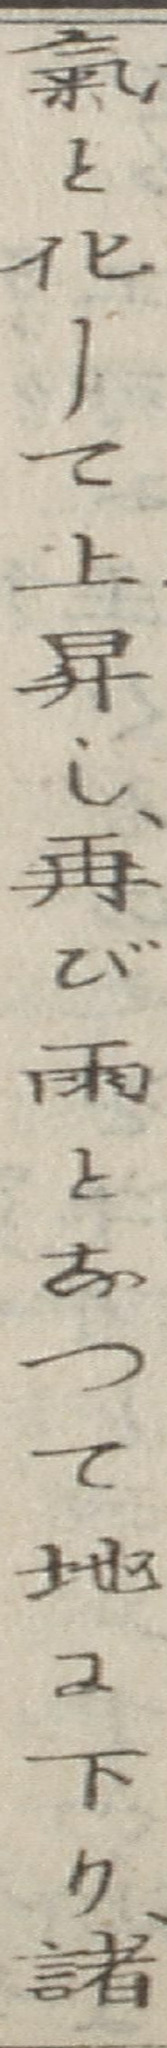気と化して上昇し、再び雨となつて地に下り、諸
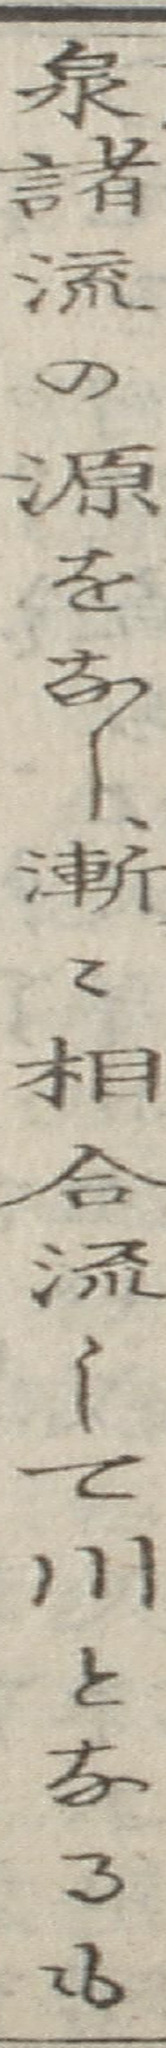泉諸流の源をなし、漸〻相合流して川となるも
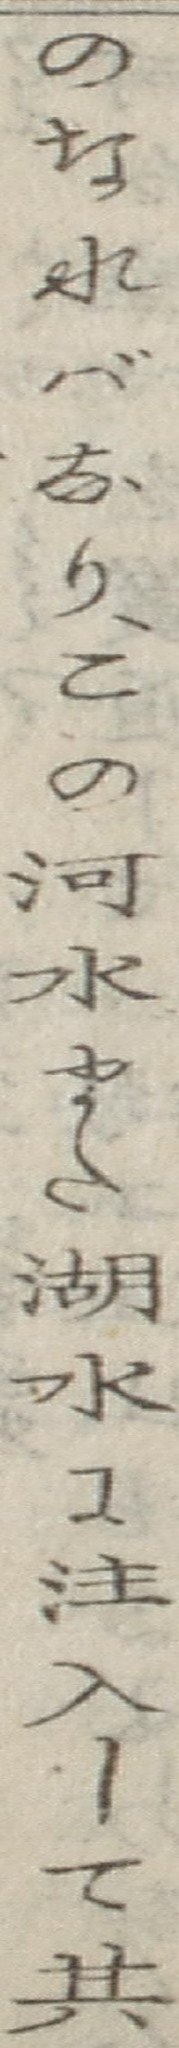のなればなり、この河水また湖水に注入して其
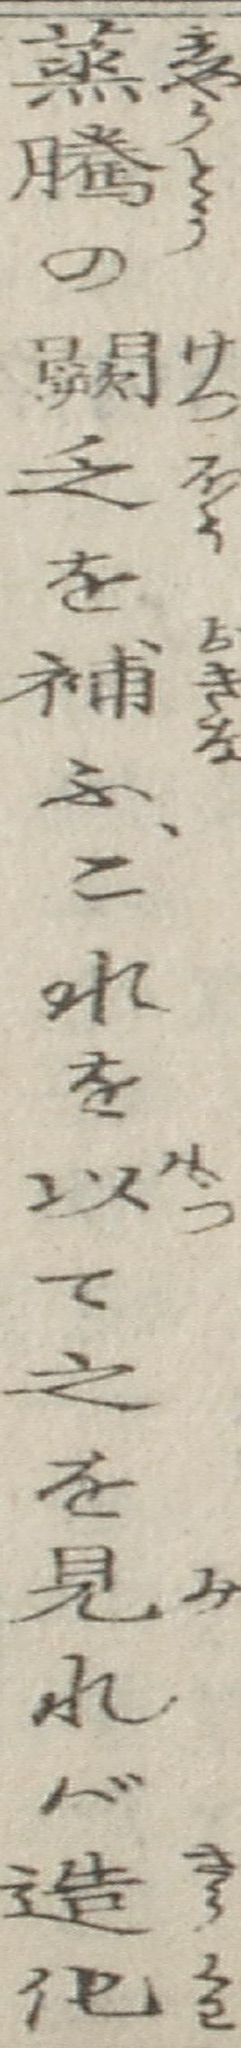蒸騰の闕乏を補ふ、これを以て之を見れば造化
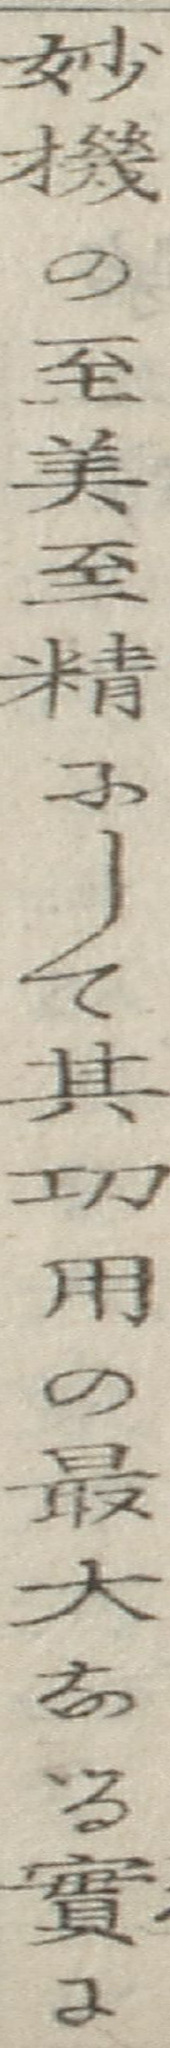妙機の至美至精にして其功用の最大なる実に
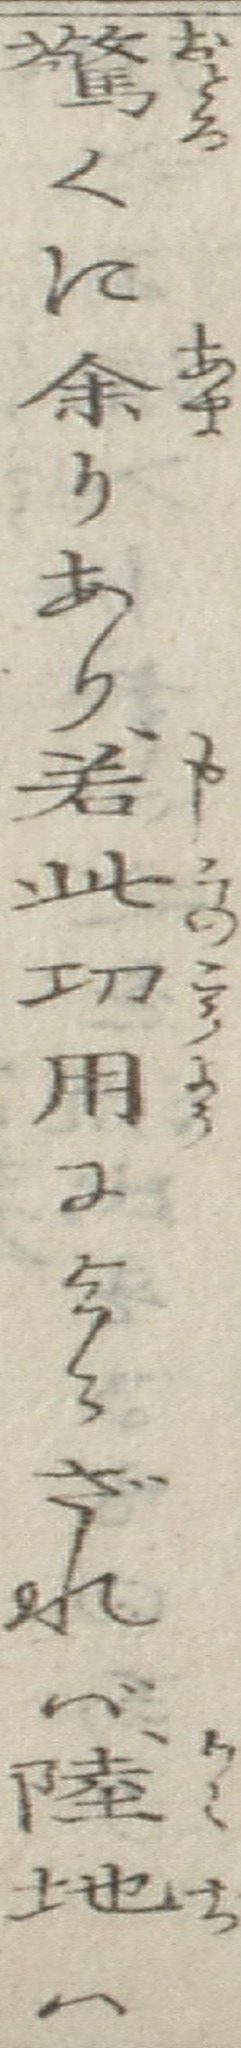驚くに余りあり、若此功用によらざれば、陸地は
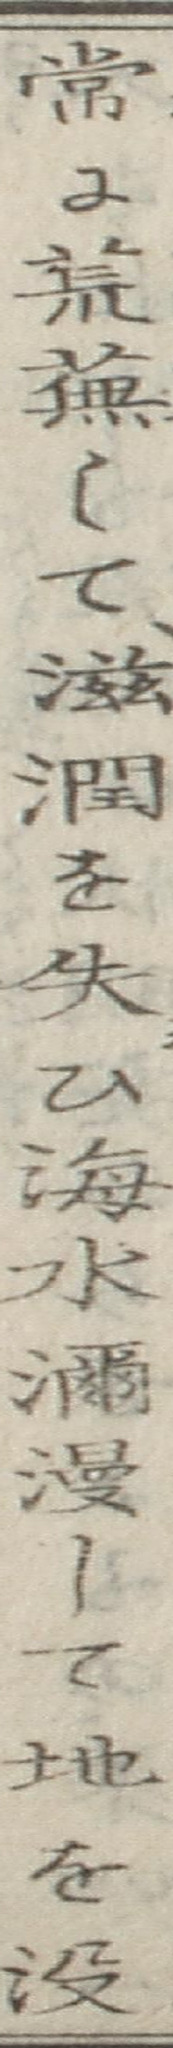常に荒蕪して、滋潤を失ひ海水瀰漫して地を没
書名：訓蒙　天然地理學　中
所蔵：東京大学地震研究所図書室 Earthquake Research Institute Library, The University of Tokyo, JAPAN
